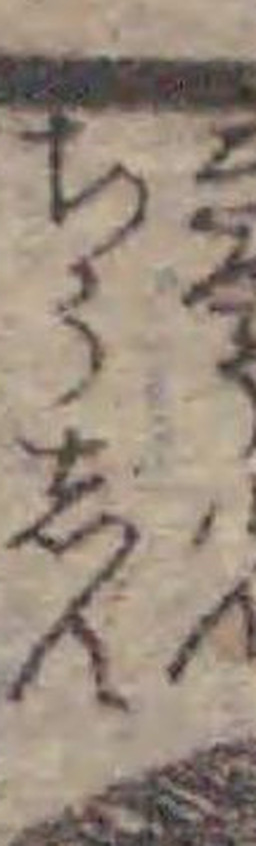ちうしん
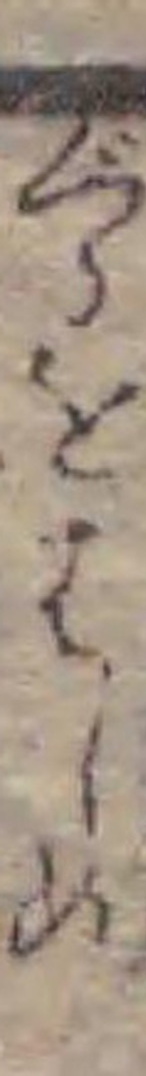ぐらをはしめ
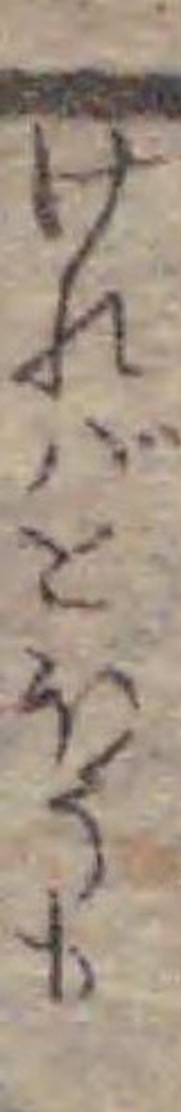ければとほうも
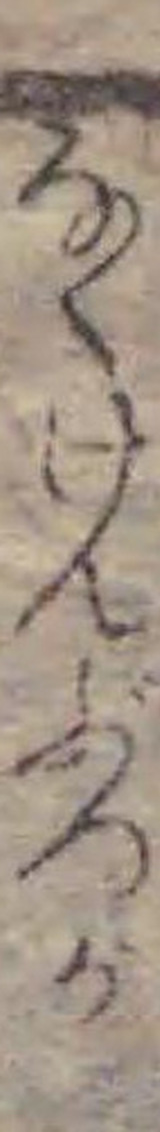なくけんぶつが
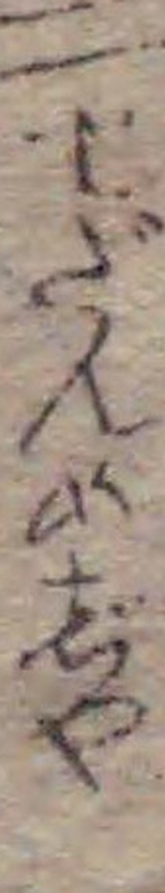七だんめじや
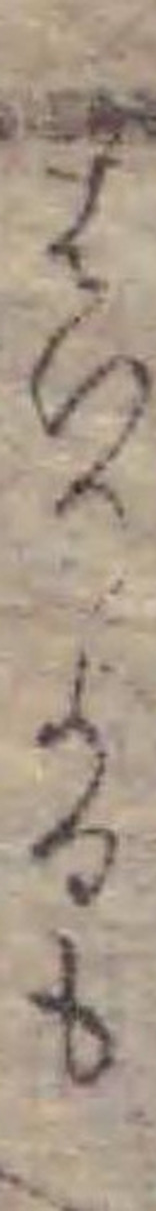はいりよるも
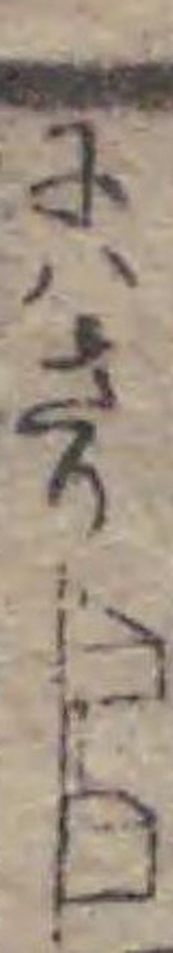にはきり
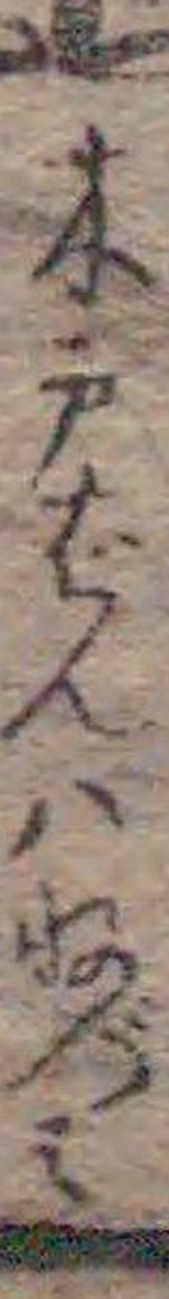木戸ばんはねづみ
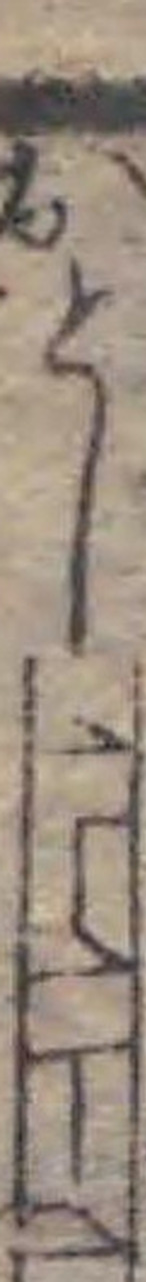おとし
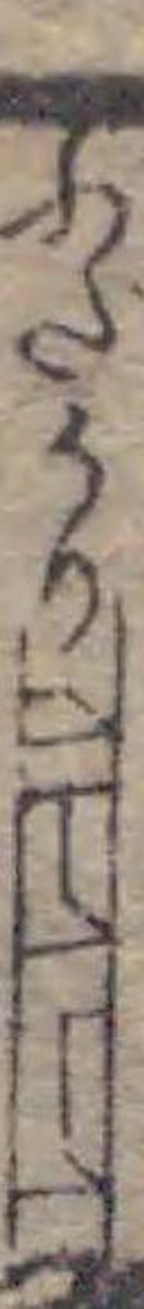ふだうり
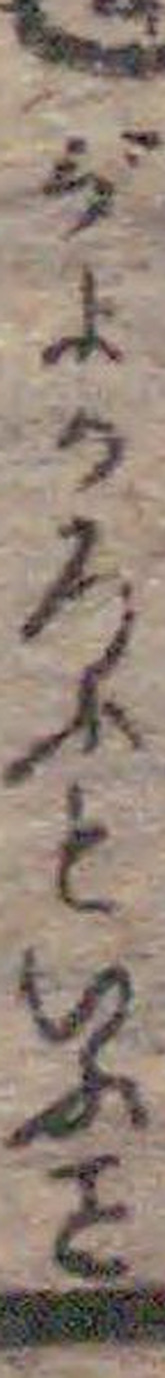がよかろふといふこと
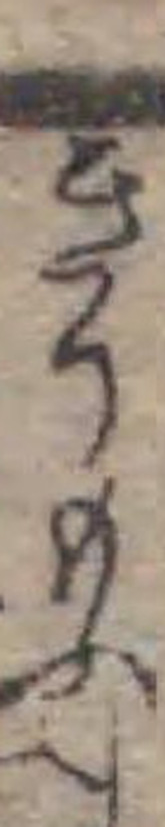きりもふ
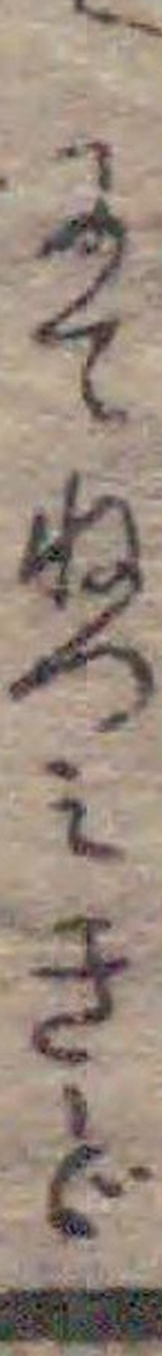にてねつみきど
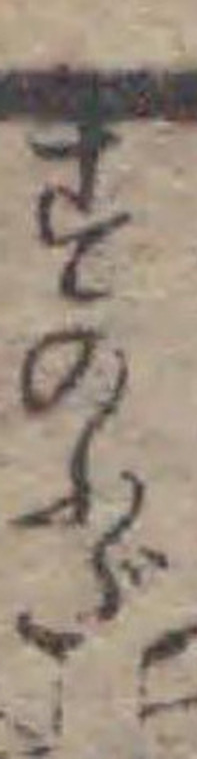すのふだ
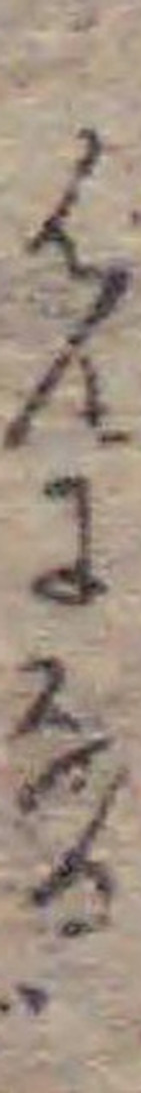ばんになる
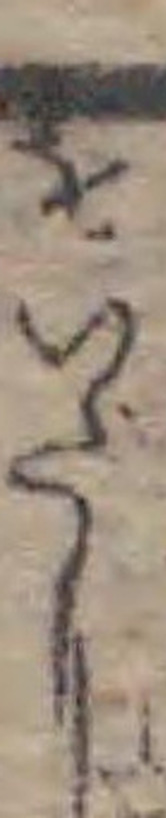をいたし
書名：化物七段目 : 2巻
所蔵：国立国会図書館 National Diet Library, JAPAN
